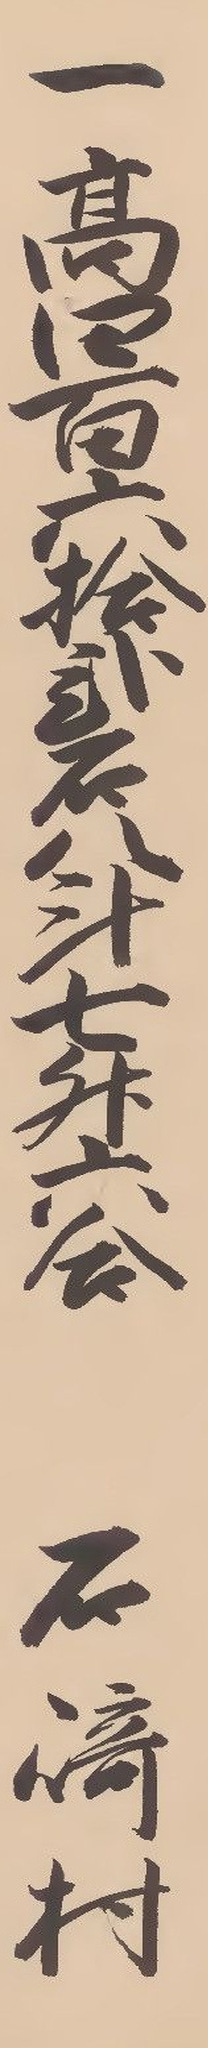一高四百六拾弐石八斗七升六合石崎村
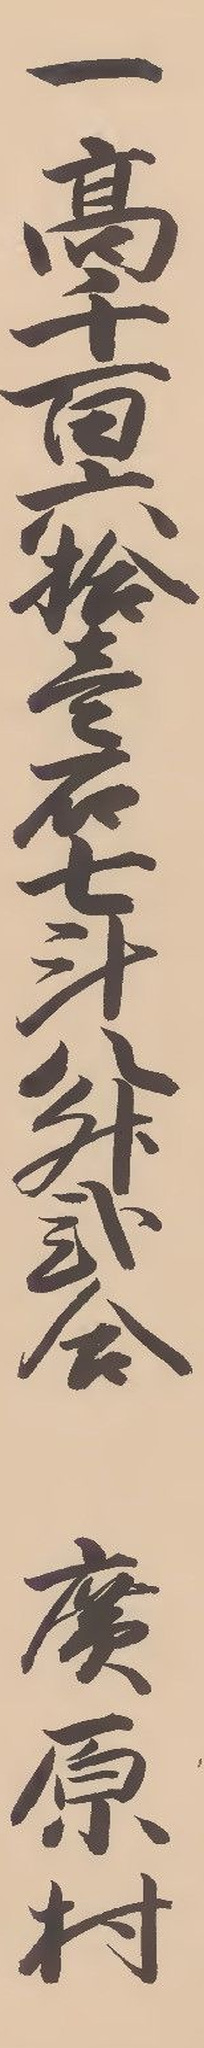一高千百六拾壱石七斗八升弐合広原村

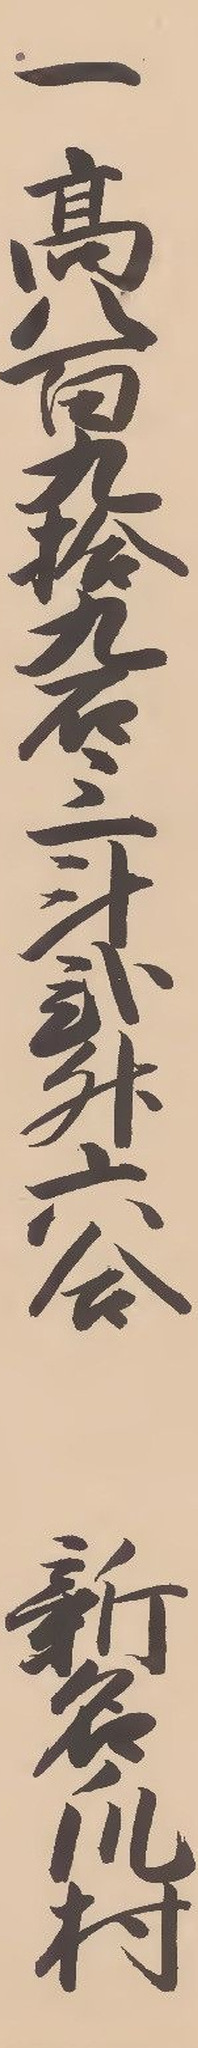一高八百九拾九石三斗弐升六合新名爪村
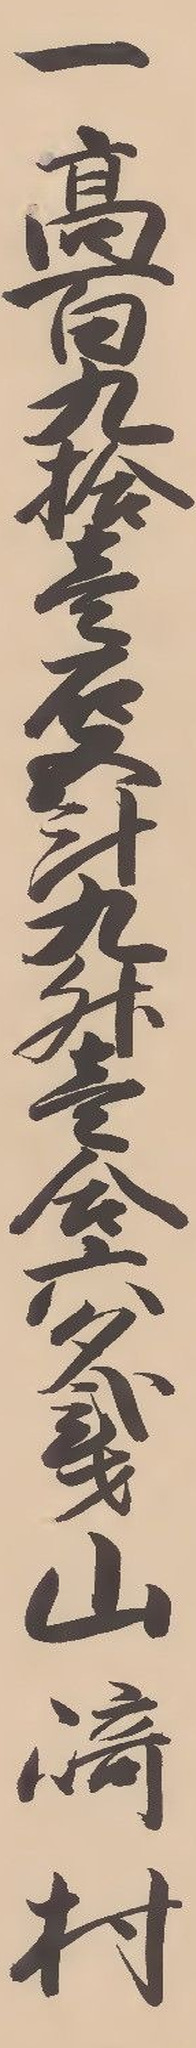一高百九拾壱石五斗九升壱合六勺弐才山崎村
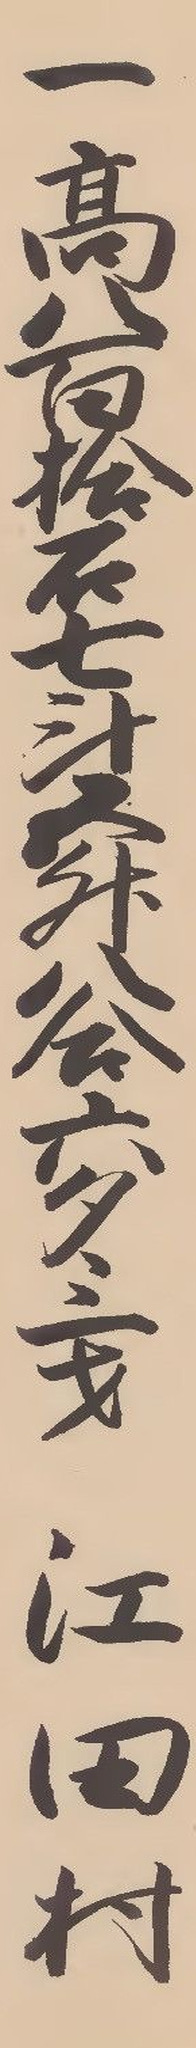一高八百拾石七斗五升八合六勺三才江田村
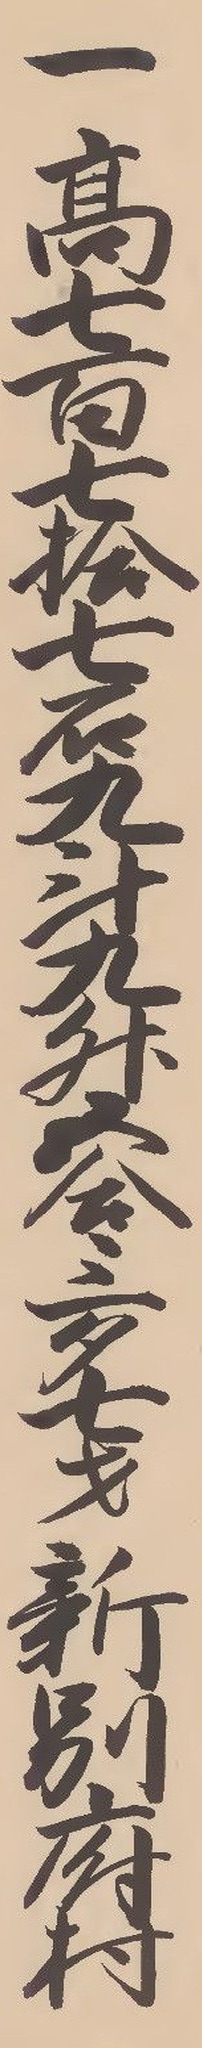一高七百七拾七石九斗九升五合三勺七才新別府村
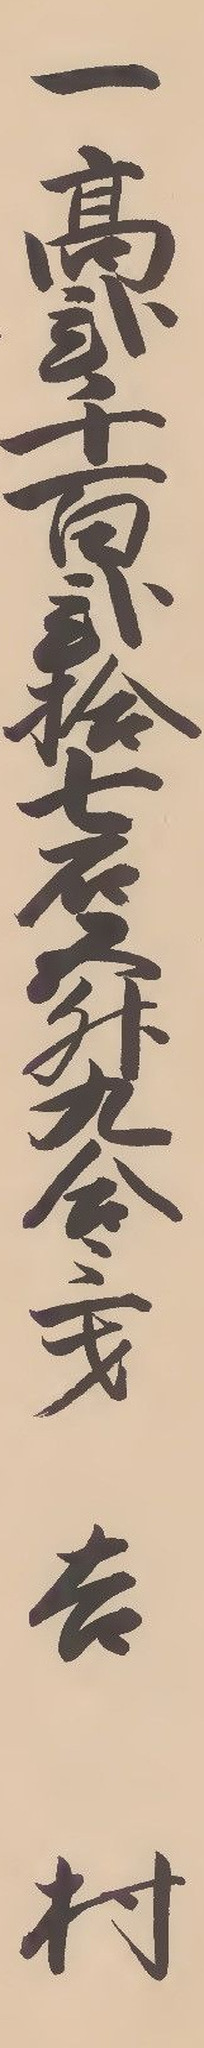一高弐千百弐拾七石五升九合三才吉村

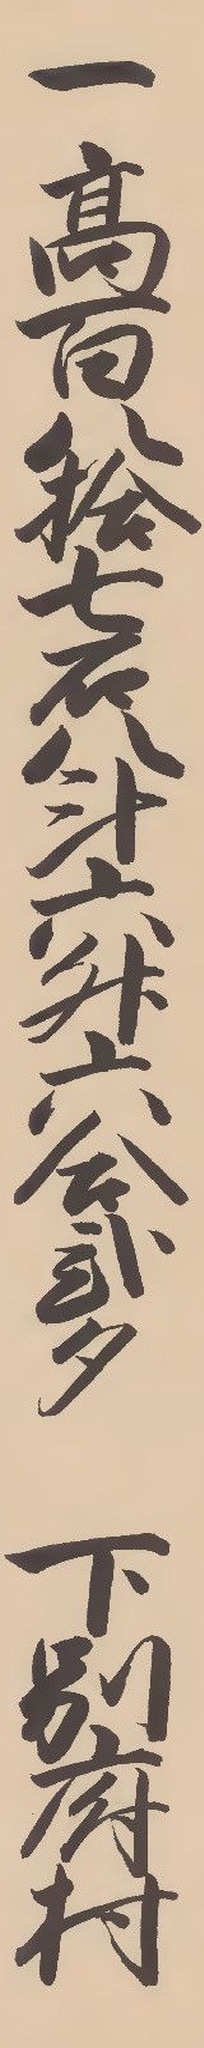一高百八拾七石八斗六升六合弐勺下別府村
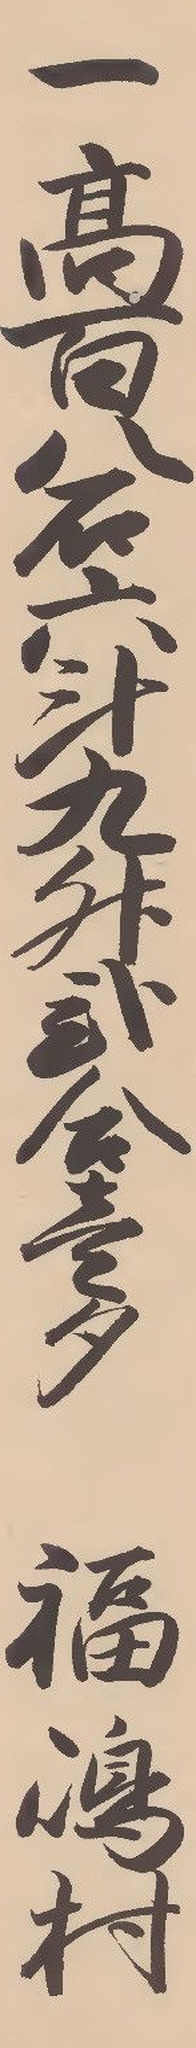一高百八石六斗九升弐合壱勺福島村
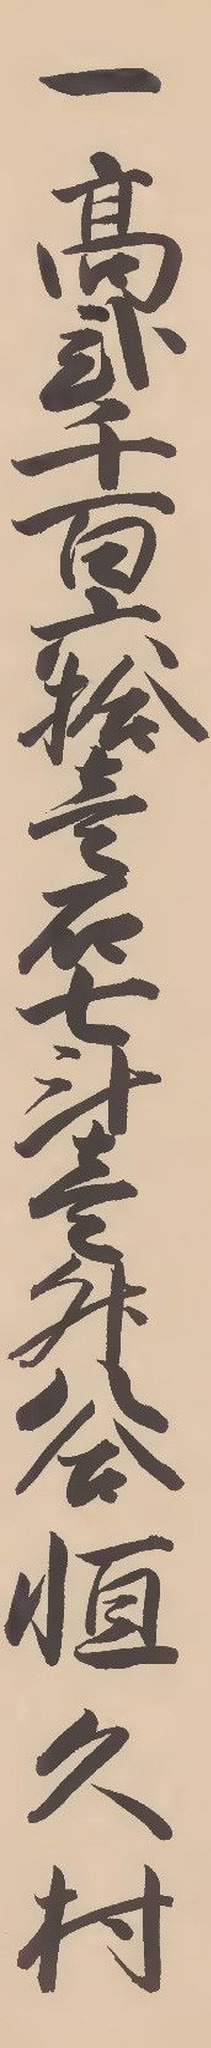一高弐千百六拾壱石七斗壱升八合恒久村
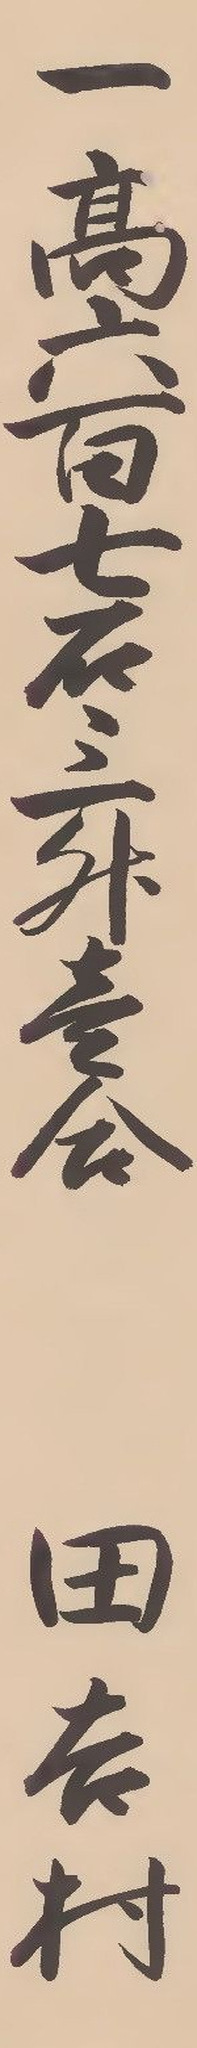一高六百七石三升壱合田吉村
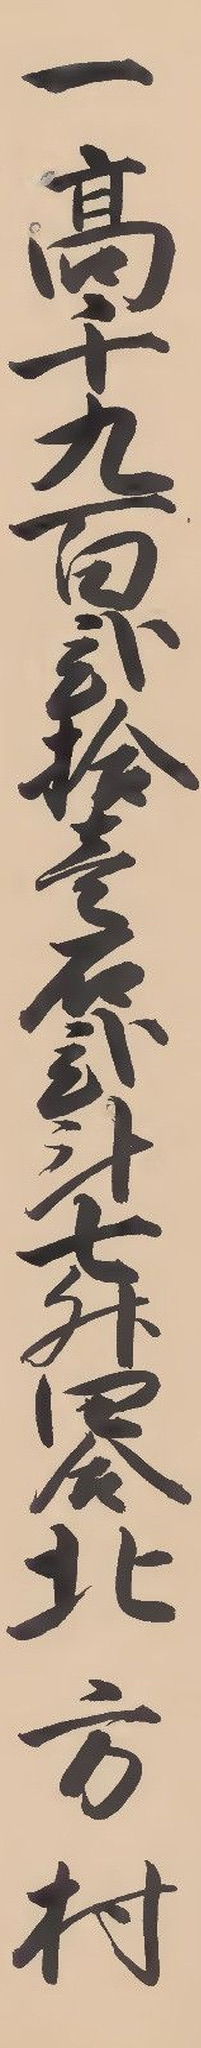一高千九百弐拾壱石弐斗七升四合北方村
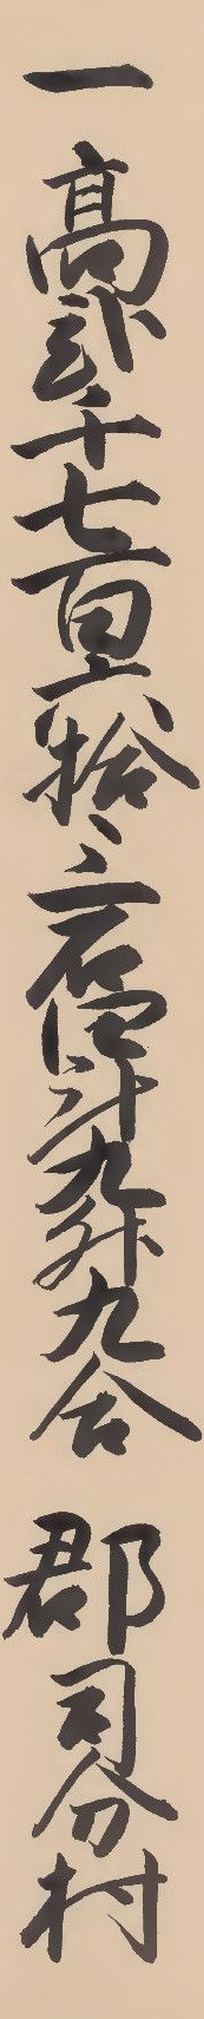一高弐千七百六拾三石四斗九升九合郡司分村
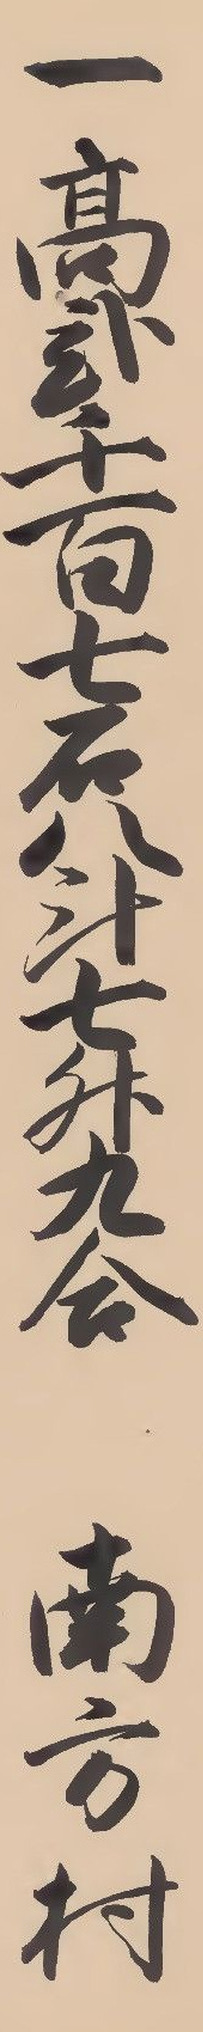一高弐千百七石八斗七升九合南方村
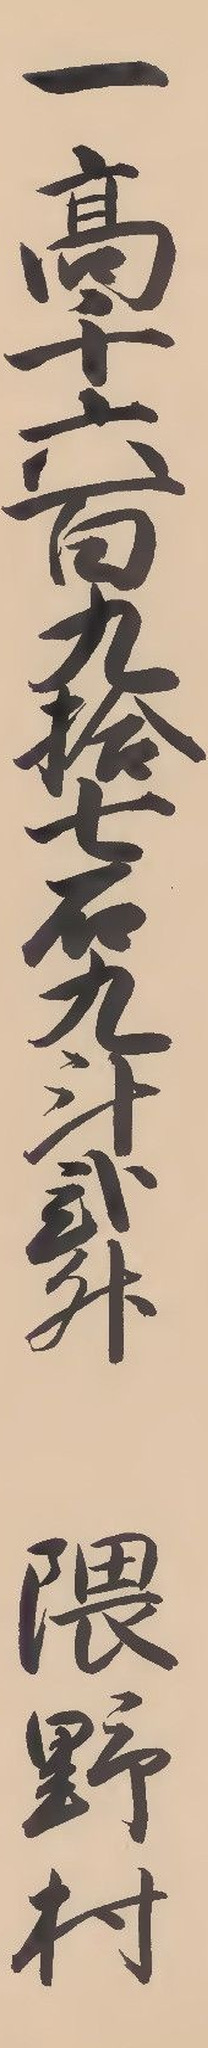一高千六百九拾七石九斗弐升隈野村

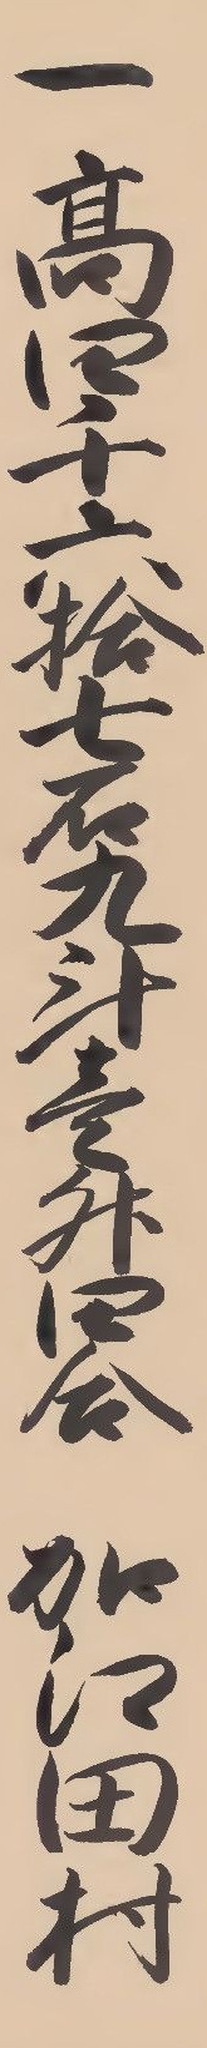一高四千六拾七石九斗壱升四合加江田村
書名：日向国郷帳
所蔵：国立公文書館 National Archives of Japan
